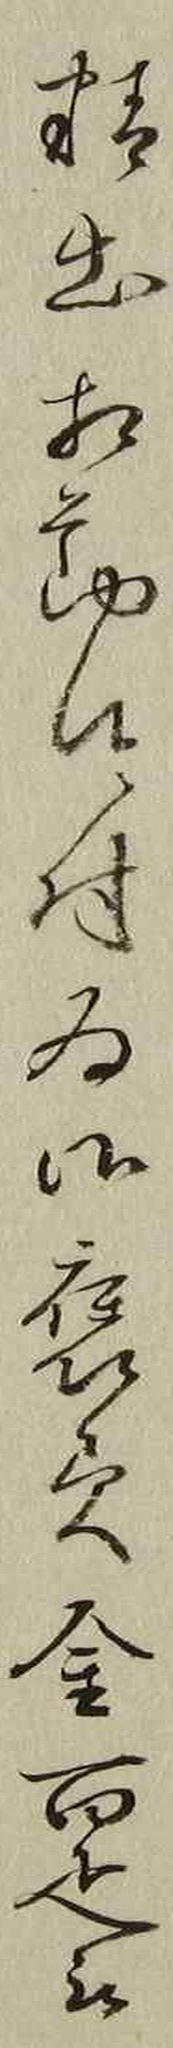精出相勤候ニ付為御褒美金百疋被
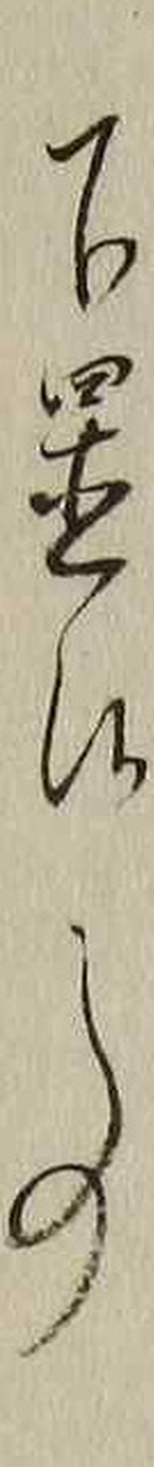下置候事
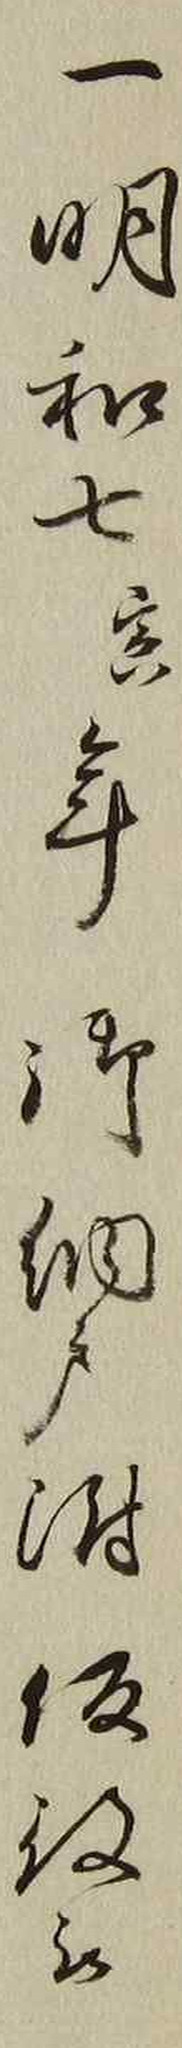一明和七寅年御納戸附仮役被
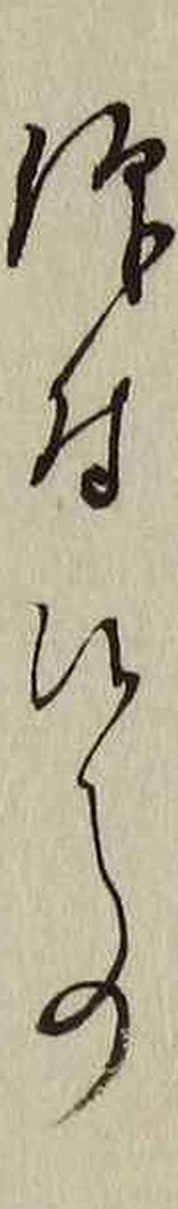仰付候事
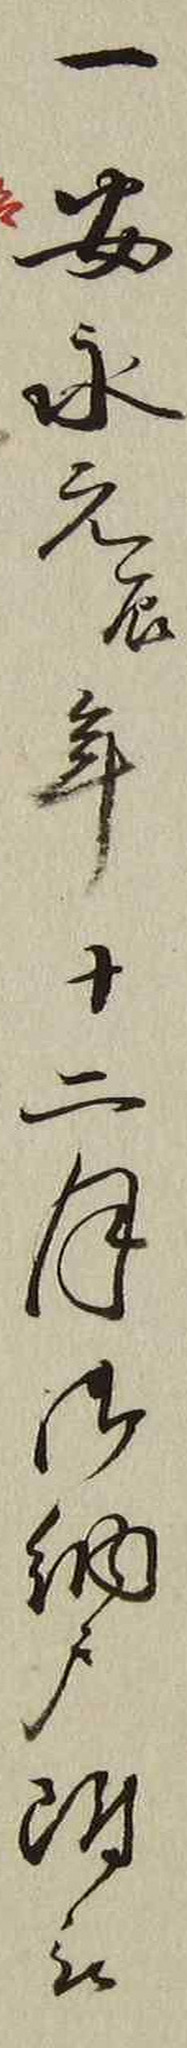一安永元辰年十二月御納戸附被
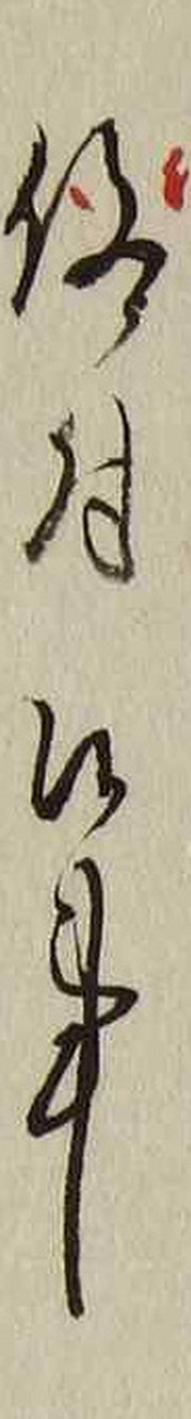仰付候事
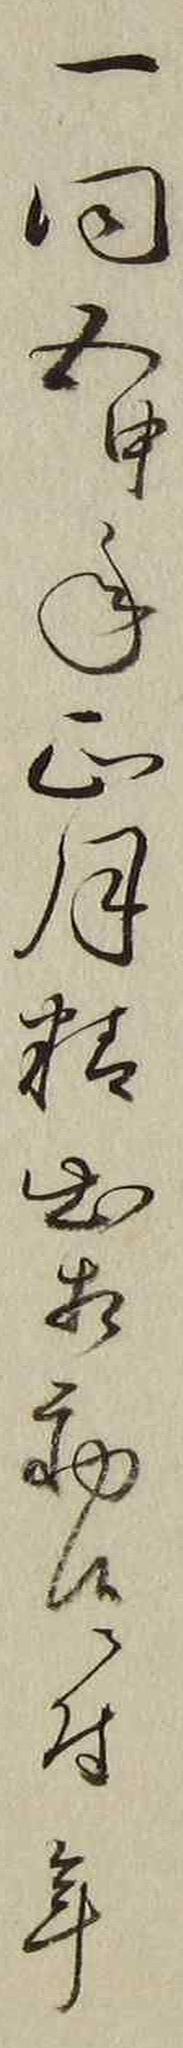一同五申年正月精出相勤候ニ付年
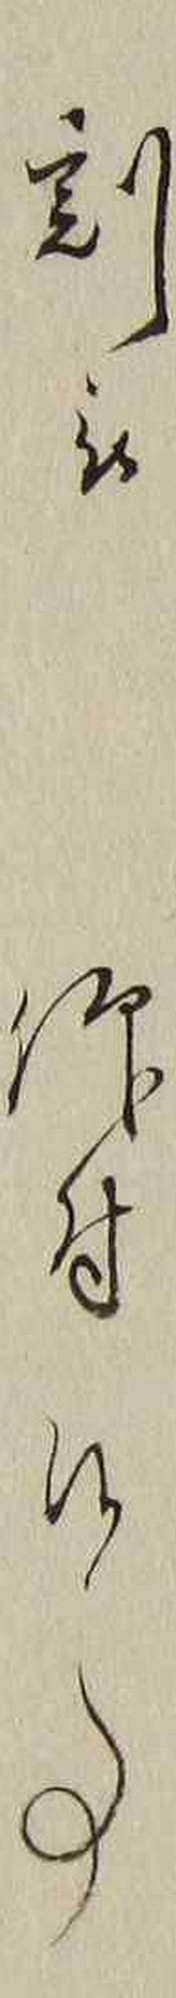割被仰付候事
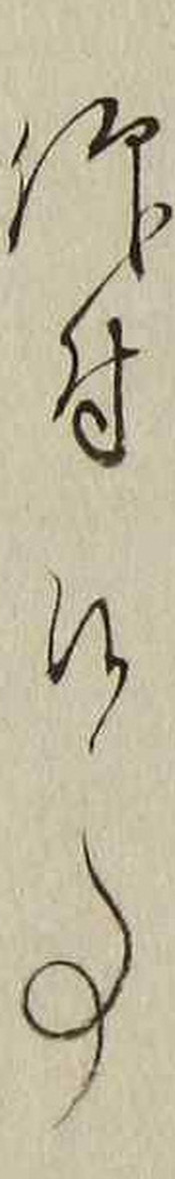仰付候事

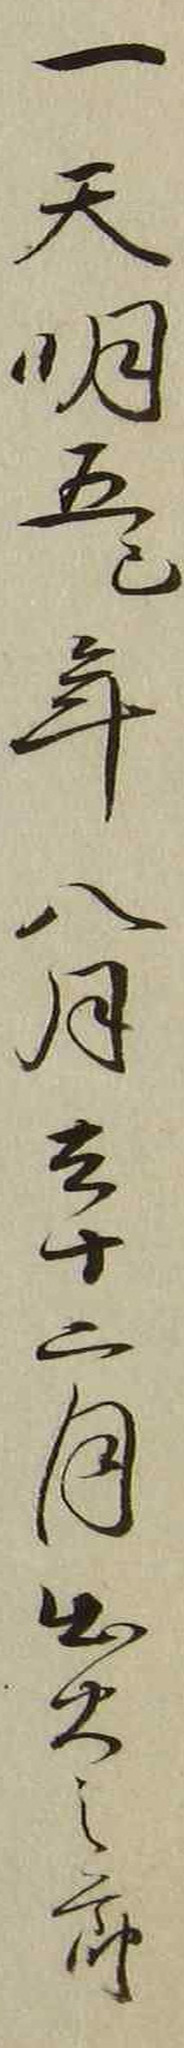一天明五巳年八月去十二月出火之節
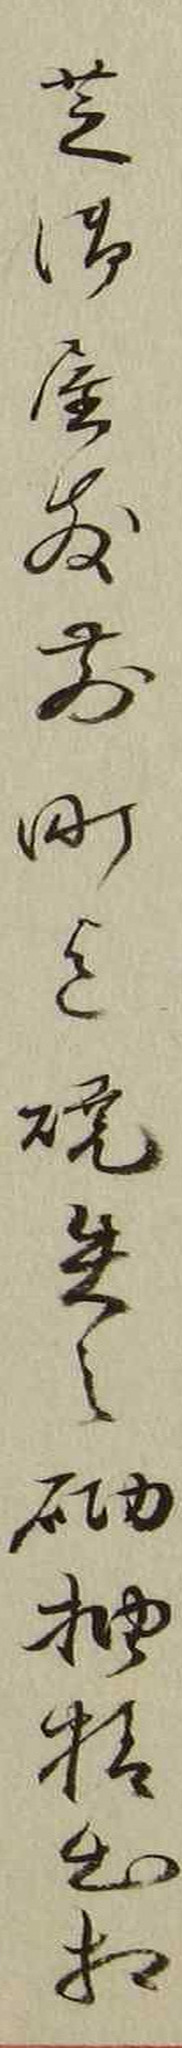芝御屋敷前町迄焼失之砌精出相
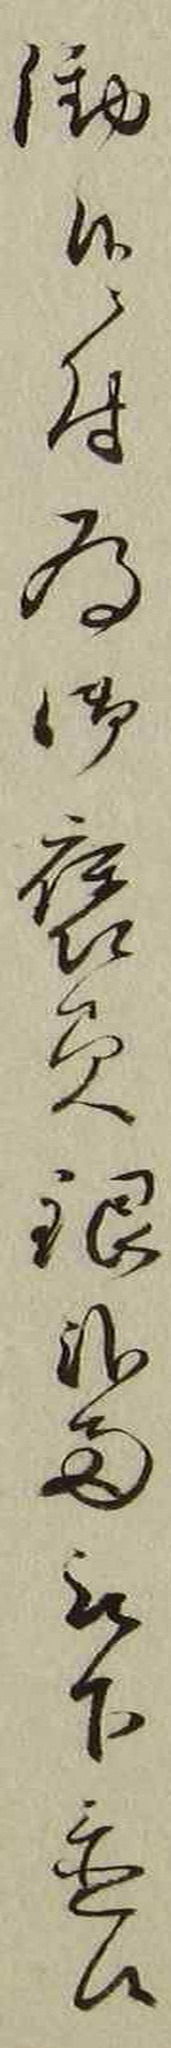働候ニ付為御褒美銀弐両被下置候
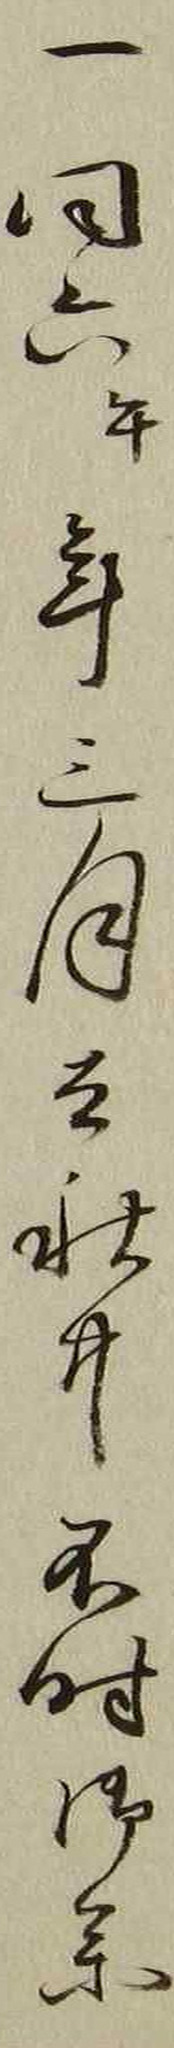一同六午年三月去秋中不時御参
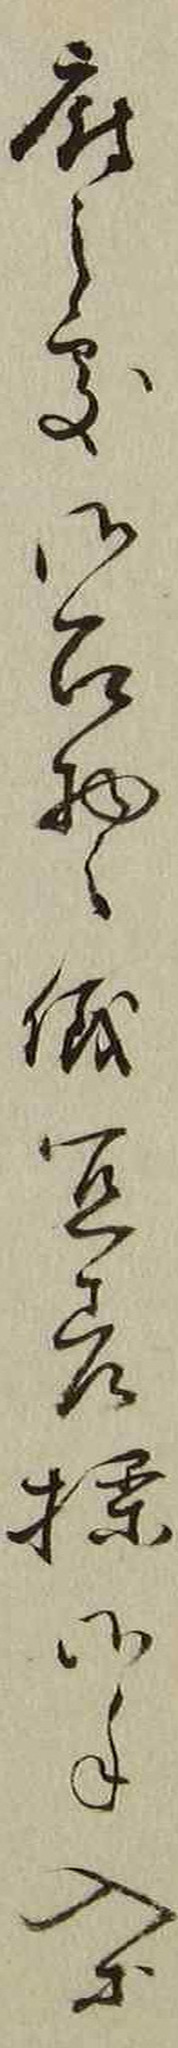府之処御召物之儀宜差操御手入等
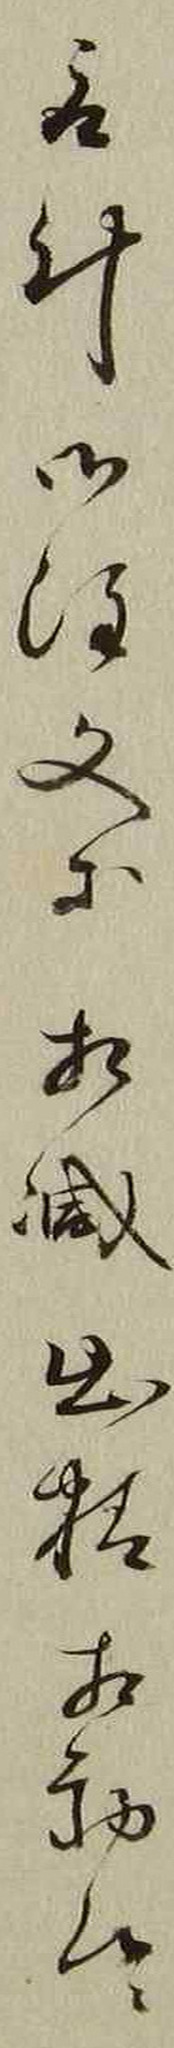取計御注文等相減出精相勤候ニ
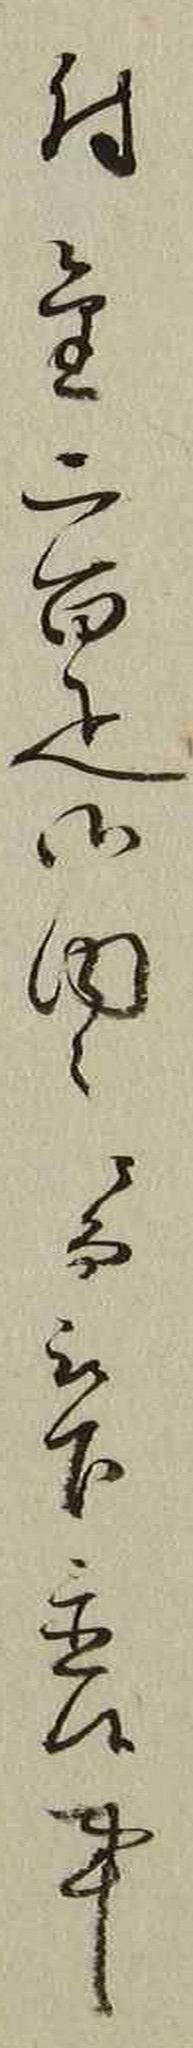付金二百匹御内々ニ而被下置候事
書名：諸士系譜　巻之4　い之部4
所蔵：会津若松市立会津図書館
